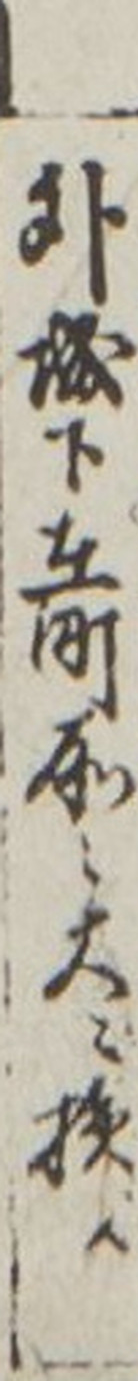外城下在町所々大に損す
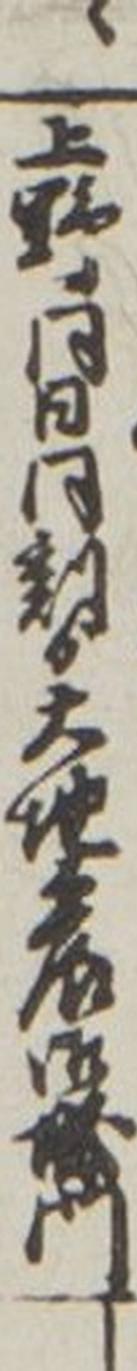上野同日同刻より大地震御城門
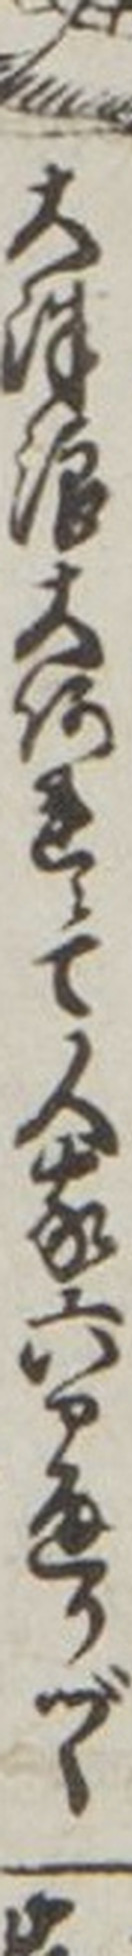大津浪大あれにて人家六部通りづゝ
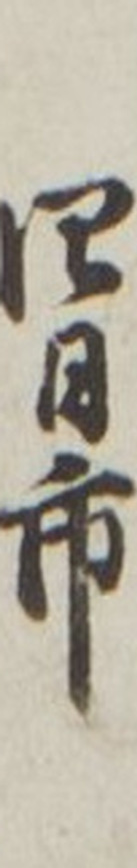四日市
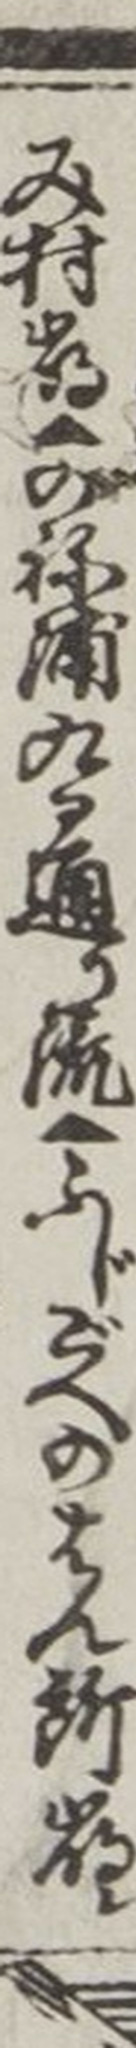み村崩▲のね浦九部通り流▲ふじごへのはん所崩れ
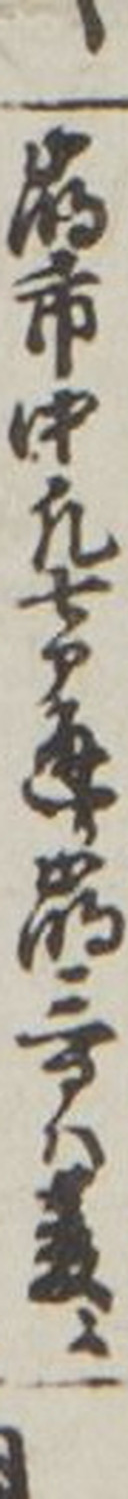崩市中凡七部通り崩三部は菱に
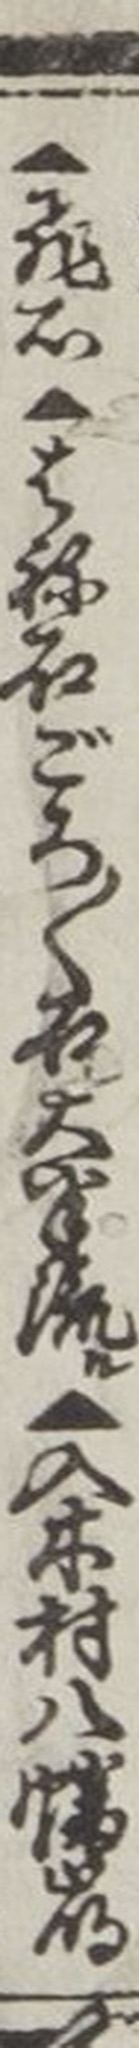▲飛石▲はね石ごろ〳〵石大半流る▲入木村八幡崩
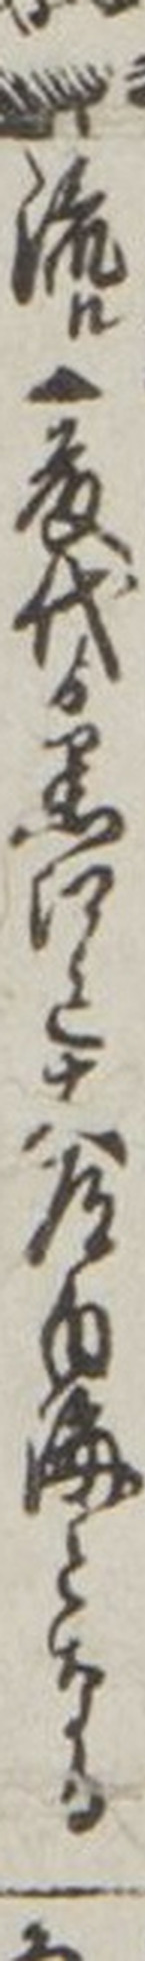流る▲藤代より黒江迄大道内海となる
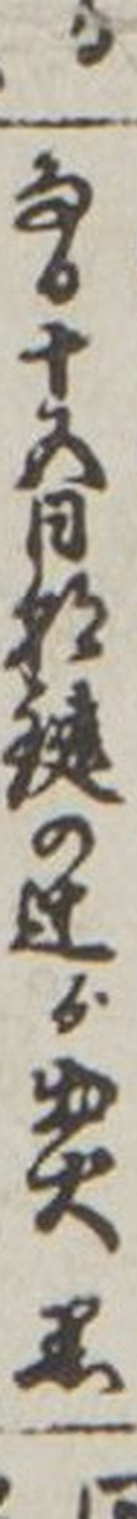なる十五日朝鍵の辻より出火黒
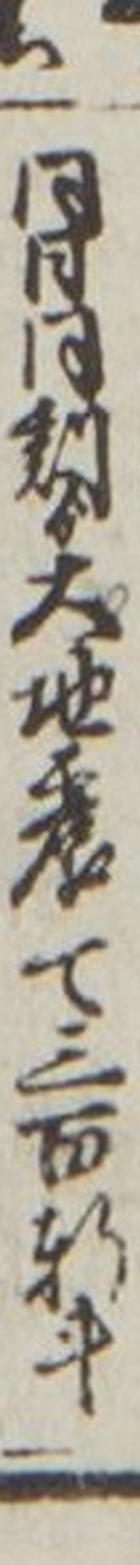同日同刻より大地震て三百軒計
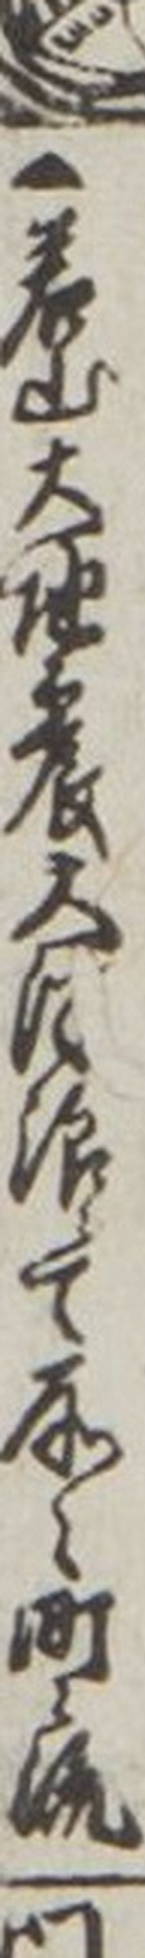▲若山大地震大津浪にて所々町々流
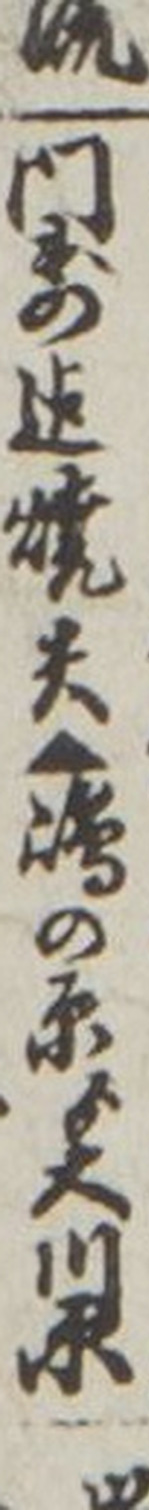門前迄焼失▲島の原より大川原
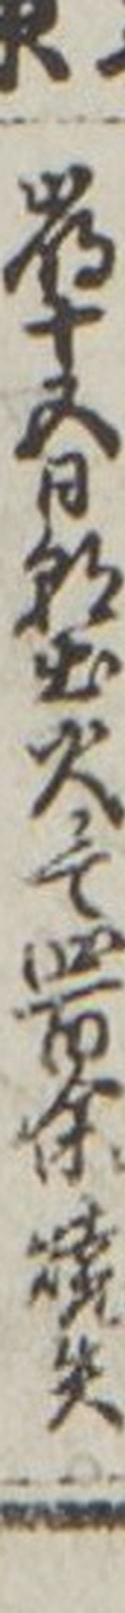崩十五日朝出火にて四百余焼失
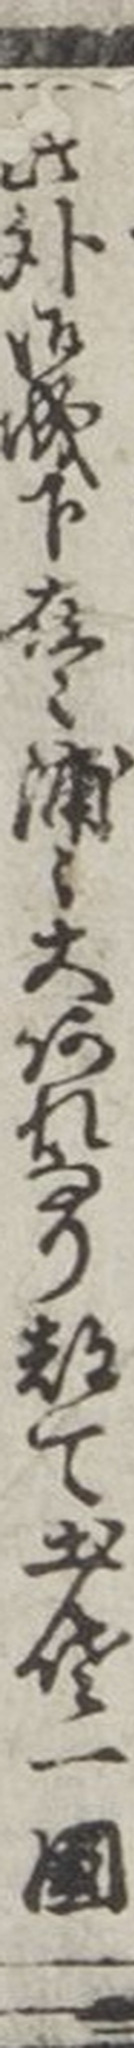此外御城下在々浦々大あれなり都て土佐一国
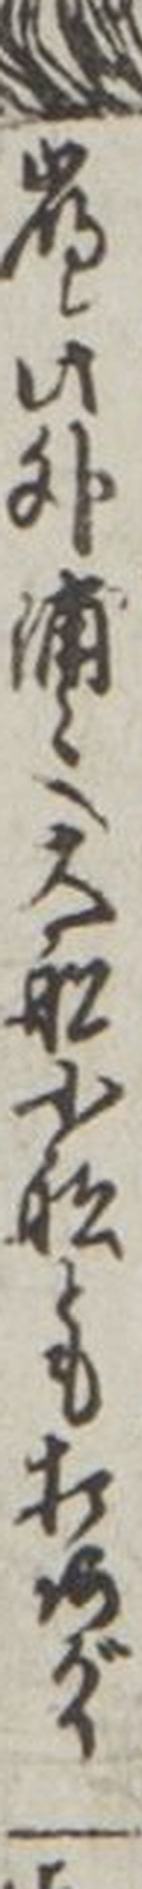崩れ此外浦々へ大船小船とも打あがり
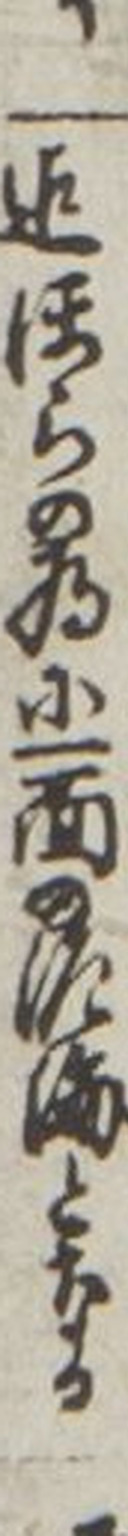迄ほらの為に一面の泥海となる
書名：嘉永七年寅十一月諸国大地震大津波并出火
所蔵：あいおいニッセイ同和損保株式会社
